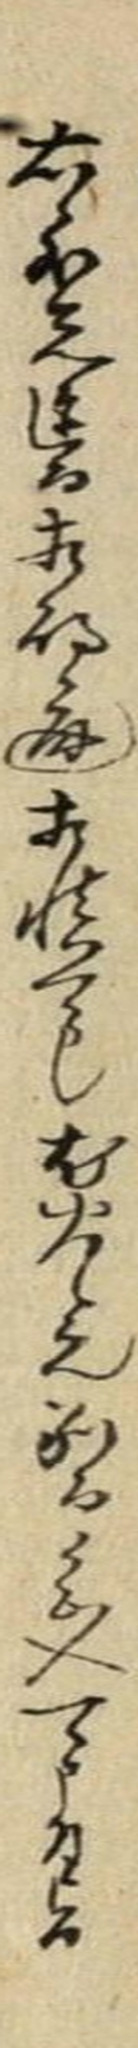右之外先達而相触候通相慎可申候尤火之元別而念入可申付旨
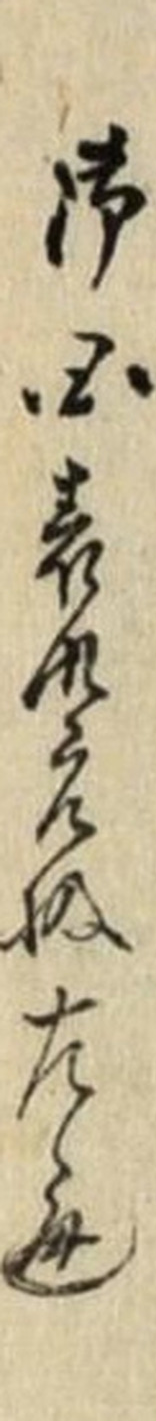御国表御取扱左之通
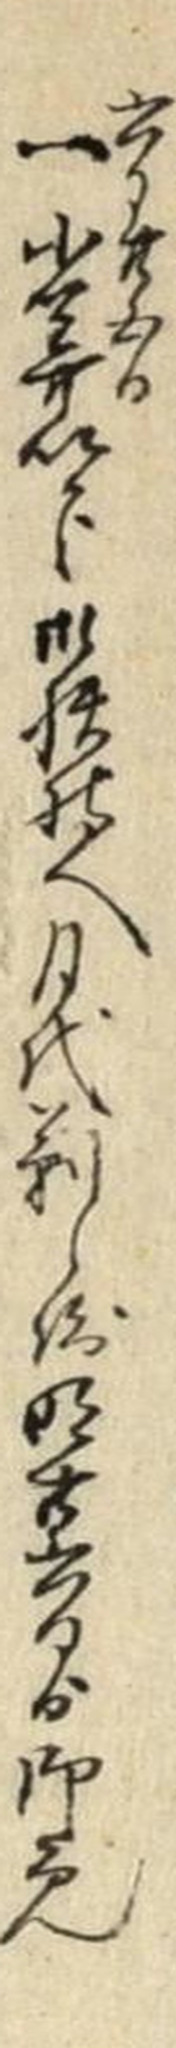一小算以下御扶持人月代剃候儀明廿六日ゟ御免
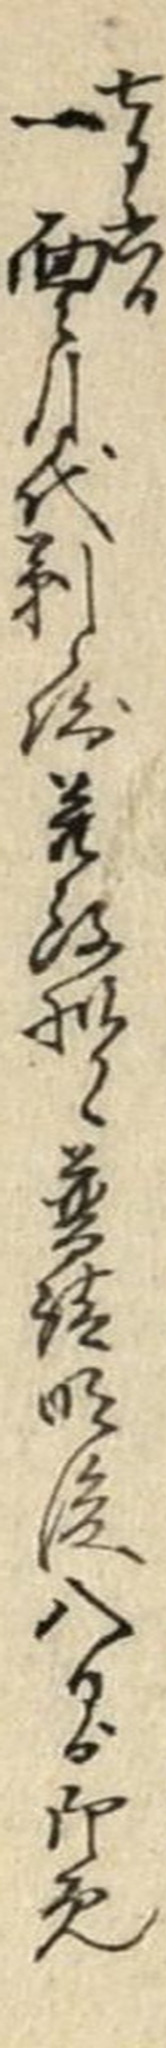一面々月代剃候儀幷致掛候普請明後八日ゟ御免
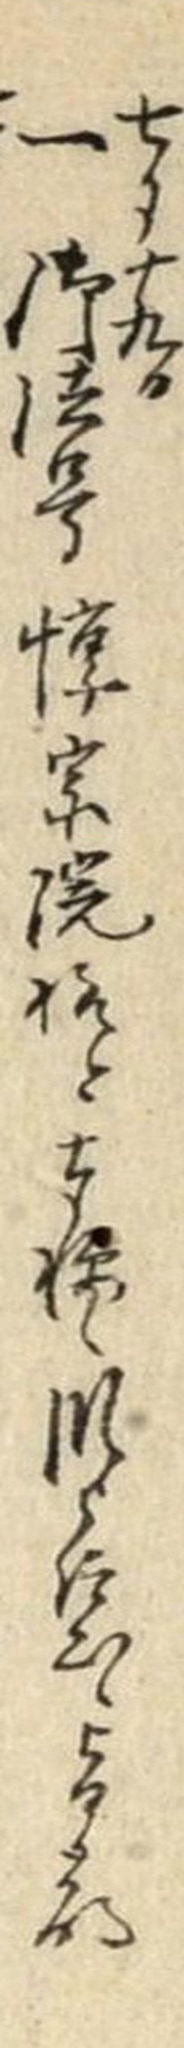一御法号惇宗院様と奉称候段被仰出候旨御触

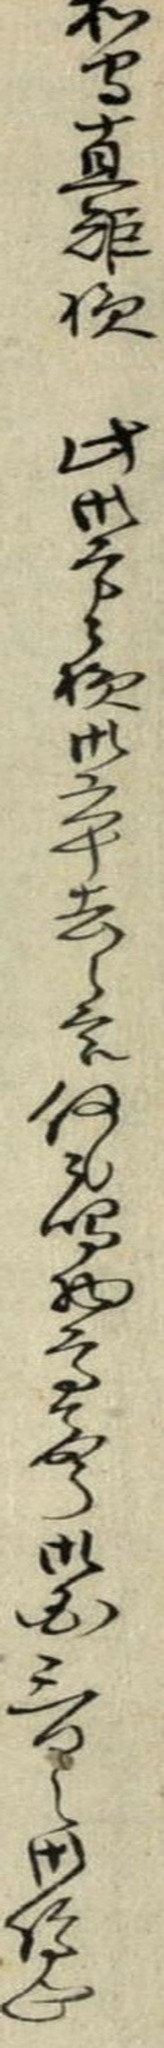大和守直矩様此御方々様御卒去之節何も鳴物高声御国三日之御停止
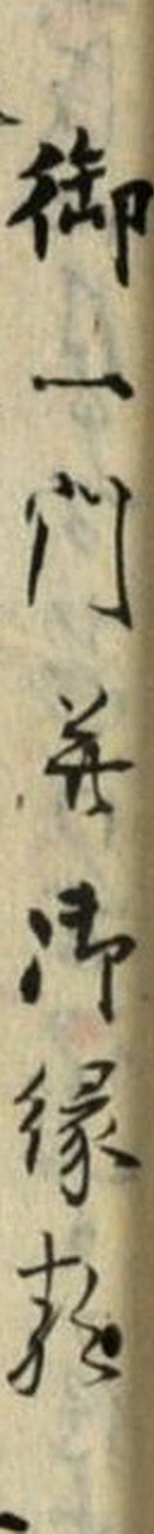御一門并御縁類
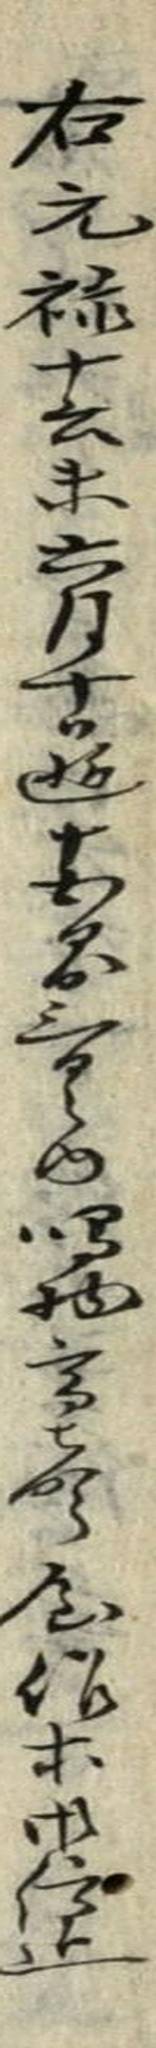右元禄十六未六月十日逝十五日ゟ三日之内鳴物高声屋作等御停止
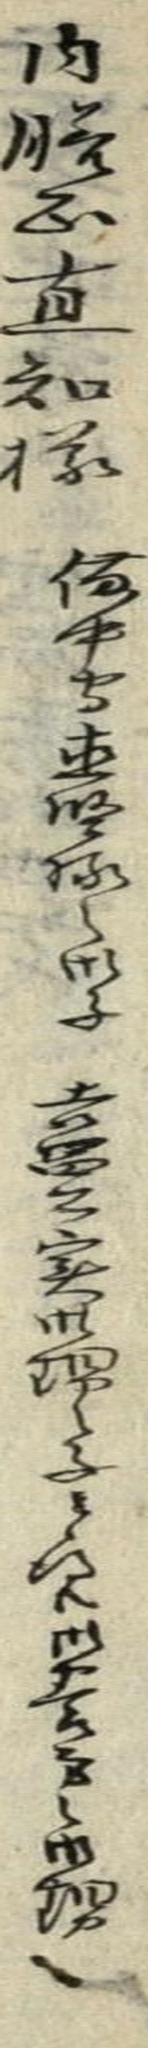一内膳正直知様備中守直堅様之御子吉品公実御甥之子に候得共御養方之御甥
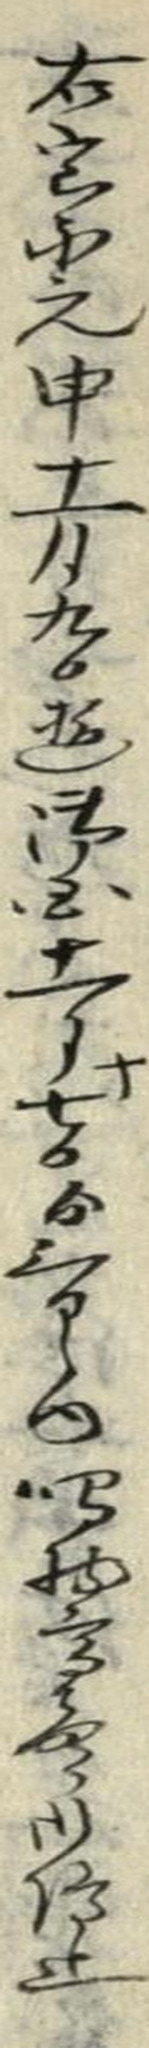右宝永元申十一月九日逝御国十一月十七日ゟ三日之内鳴物高声御停止
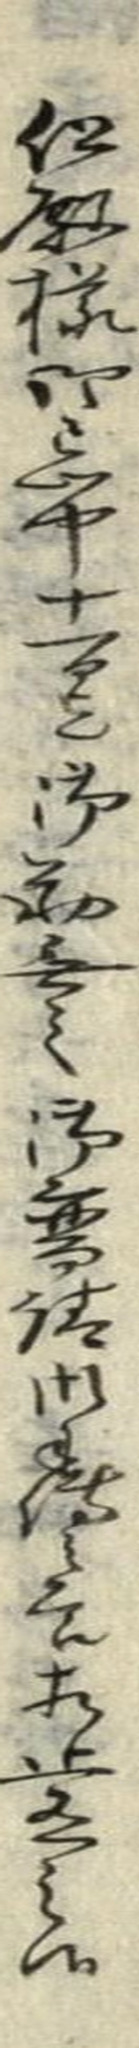但殿様御忌中十一日迄御勤無之御普請御手伝之節相止有之候
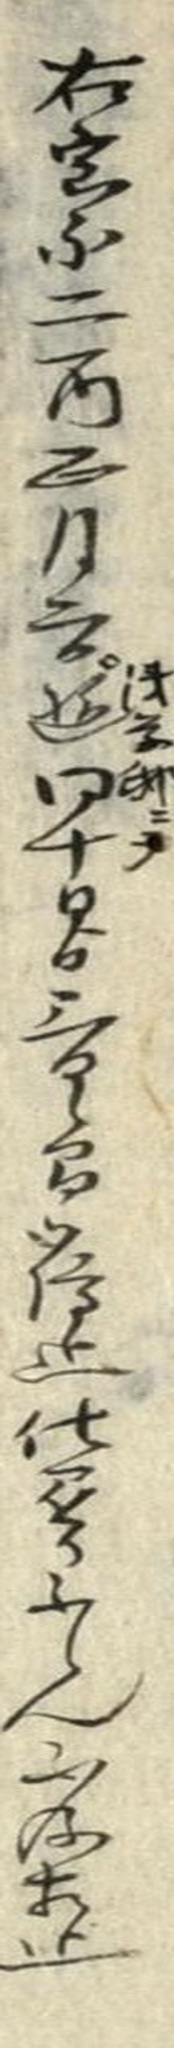右宝永二酉正月二日◦逝同浅草邸ニテ十日ゟ三日之間御停止仕懸りふしん不及相止
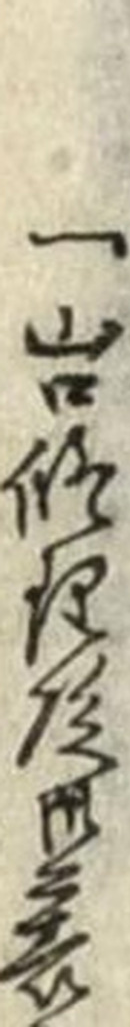一山口修理殿御裏方様
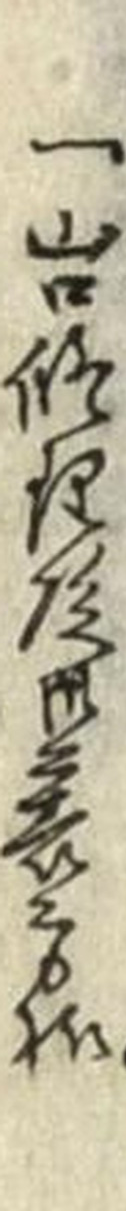一山口修理殿御裏方様
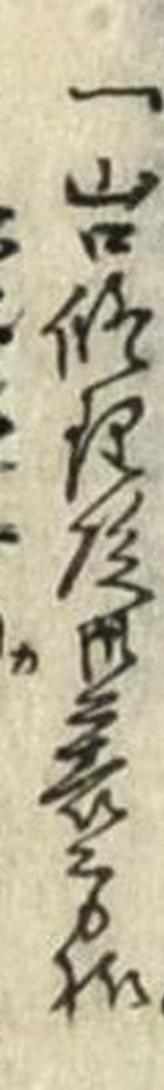一山口修理殿御裏方様
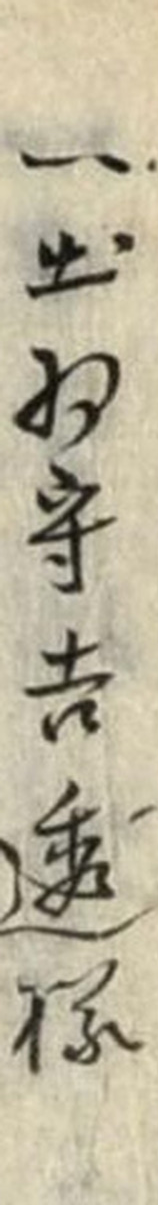一出羽守吉透様
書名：御停止異変死失
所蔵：福井県文書館 Fukui Prefectural Archives
